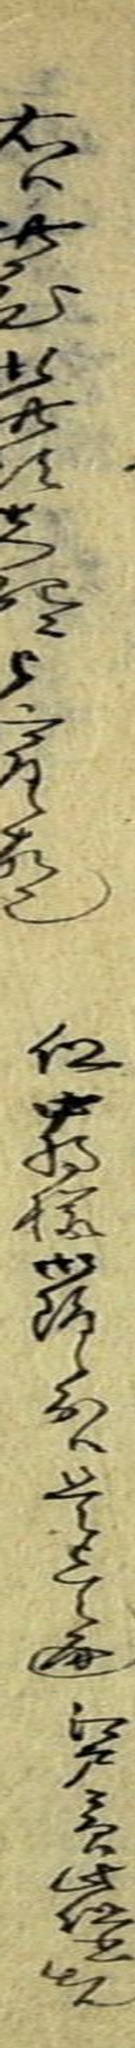右は此度御供頭支配に被仰付故也但中将様御附之分は是迄之通江戸に而は此但書出ル
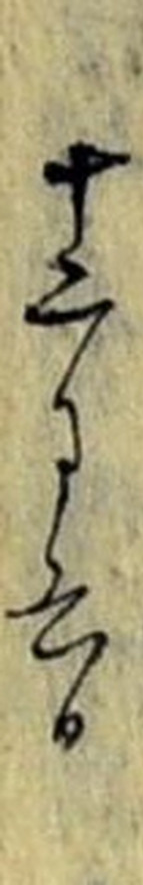十二月六日
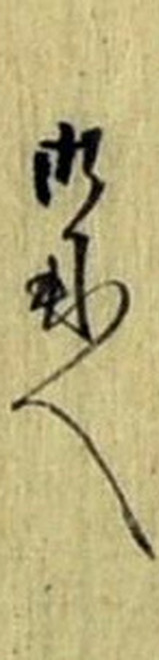御用人
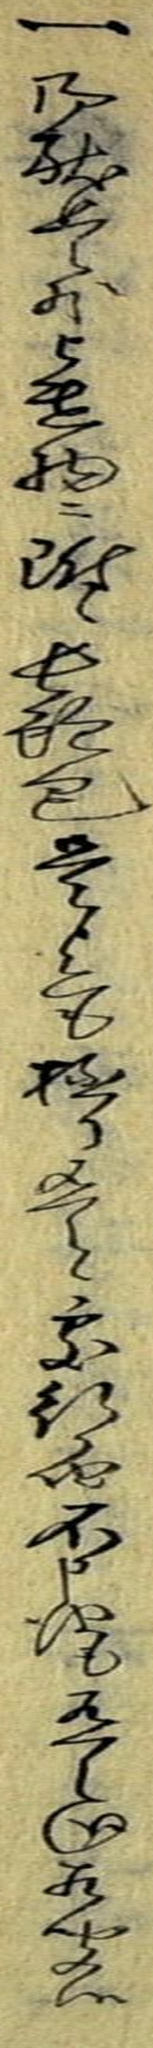一御献上之外被遣物に附候長蚫包是迄も極り有之候処行届不申儀も有之趣相聞候
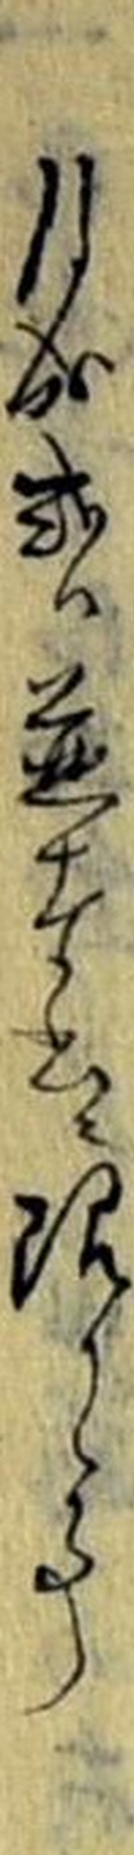月成或は並奉書に限候事

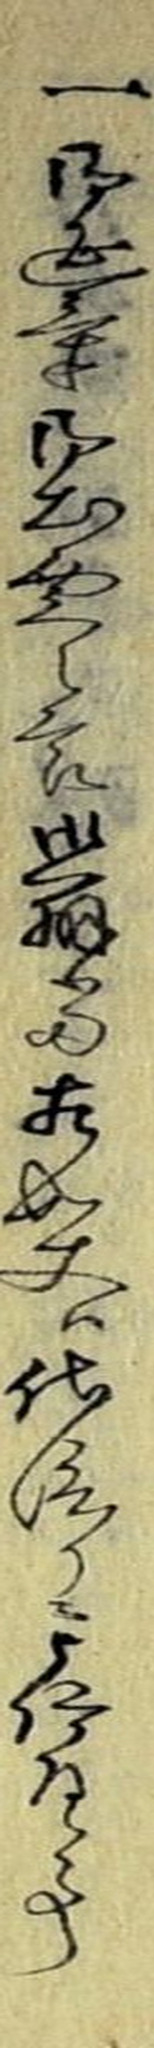一御延気御出殿之節御辨当相成丈は代渡りに被仰付候事
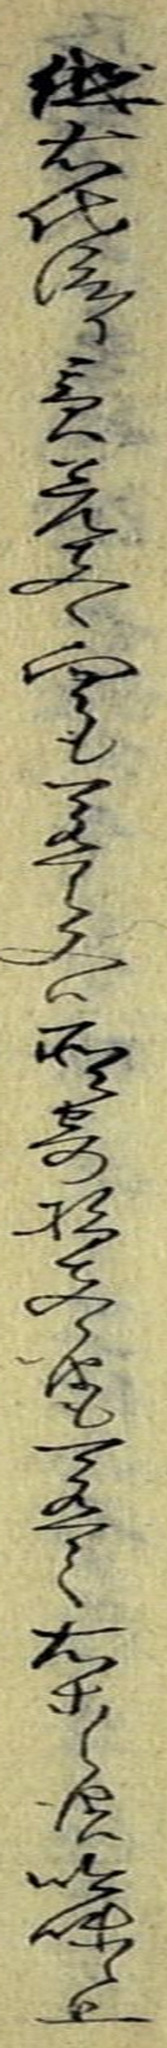但右代渡りに而は差支之向にも可有之又は所に寄指支之儀も可有之右等之儀は吟味之上
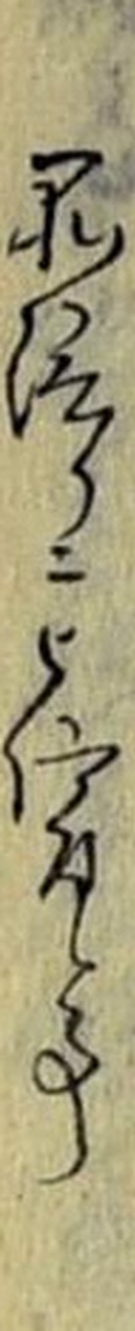品渡りに被仰付候事
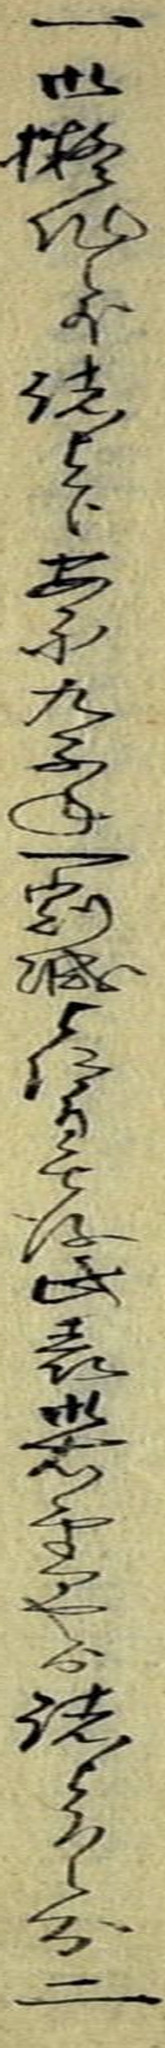一御擬作之外諸被下安永九子年一割減被仰付其後此表御右筆部やゟ諸被下候分二
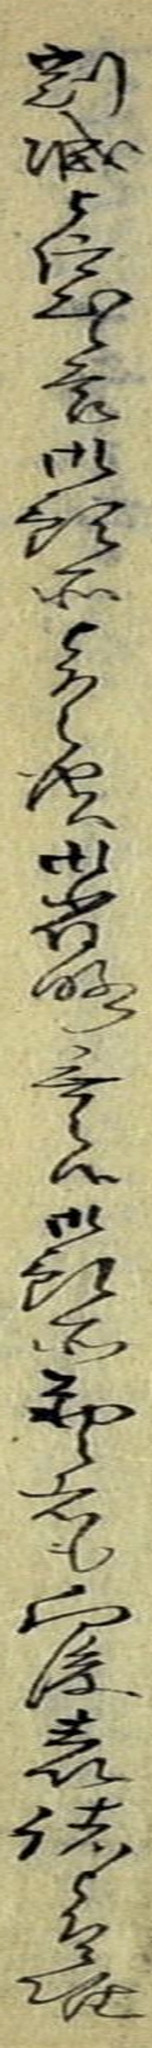割減被仰出候節御預所被下候儀は御省略無之候御預所勤候者も向後表諸被下に准
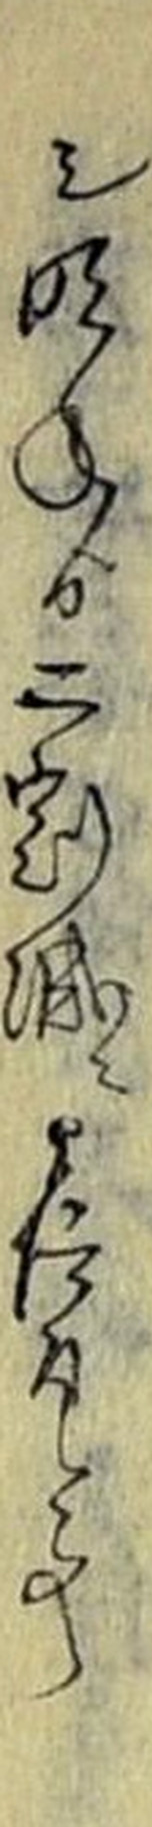し明年ゟ二割減に被仰付候事
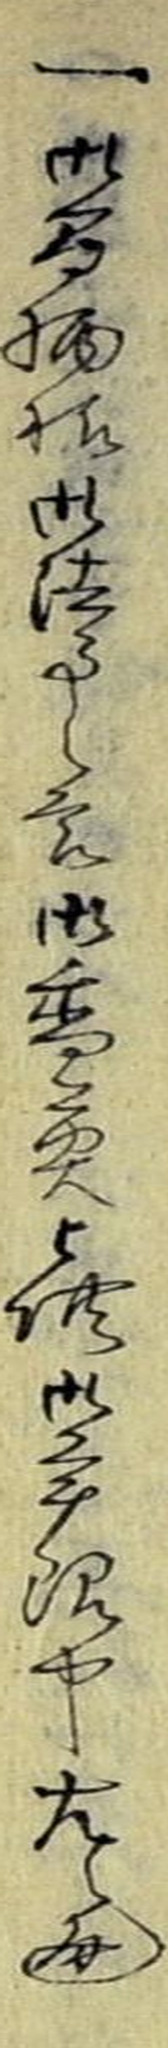一御間柄様御法事之節御香典被供御年限中左之通
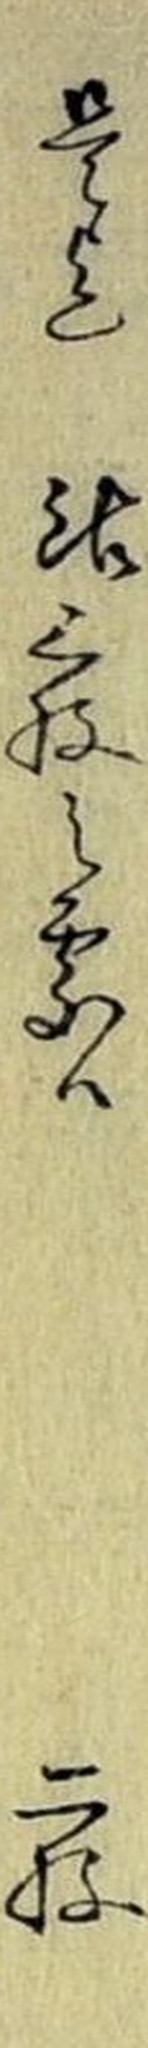是迄銀三枚之処は二枚
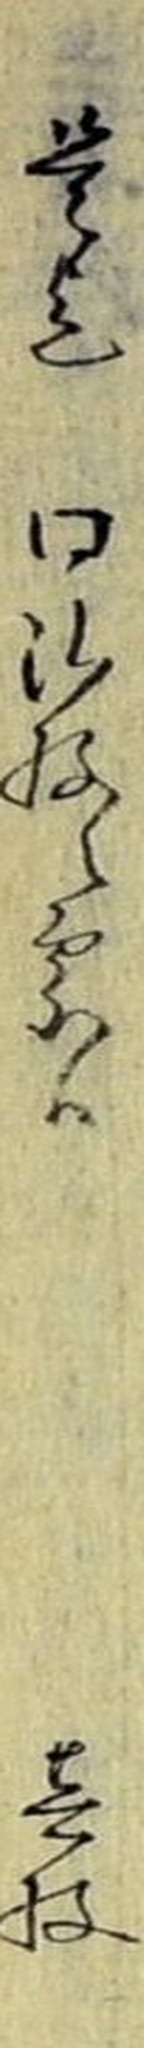是迄同弐枚之処は壱枚
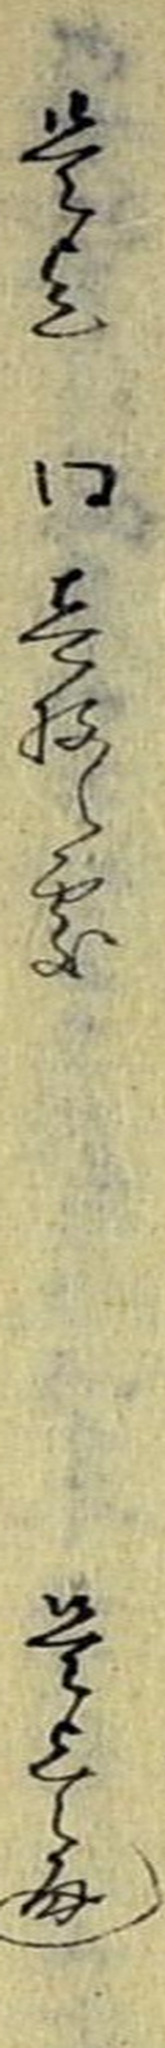是迄同壱枚之処是迄之通
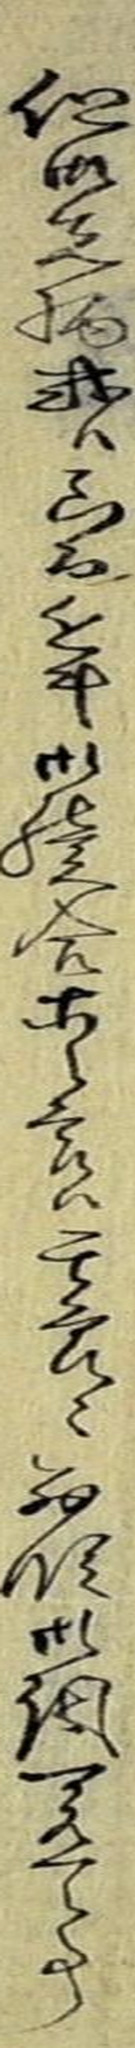但御先柄或は至而近キ御続合等之節は其節々別段御調可有之事
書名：命令之部 四
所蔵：福井県文書館 Fukui Prefectural Archives
